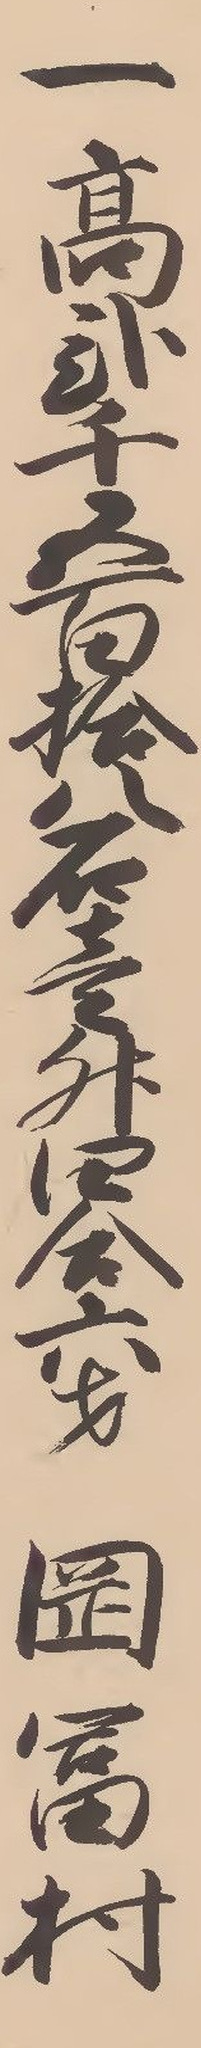一高弐千五百拾八石壱升四合六才岡富村

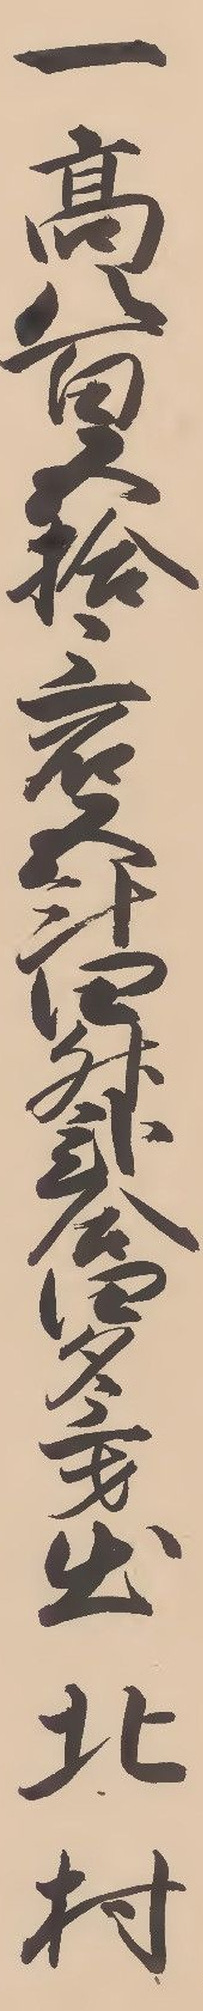一高八百五拾三石五斗四升弐合四勺三才出北村
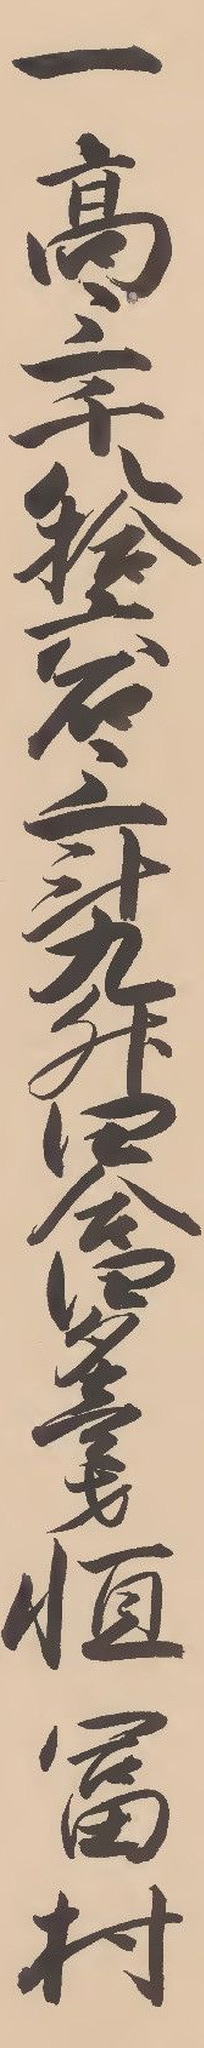一高三千八拾六石三斗九升四合四勺壱才恒富村
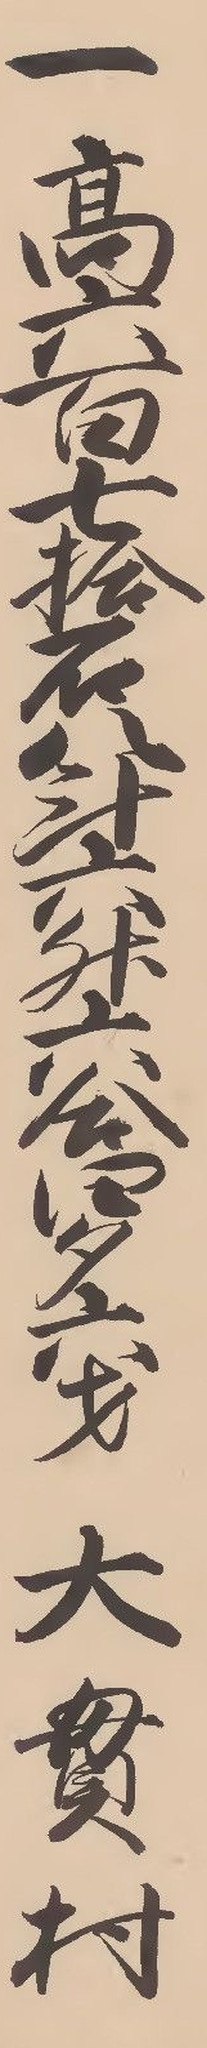一高六百七拾石八斗六升六合四勺六才大貫村
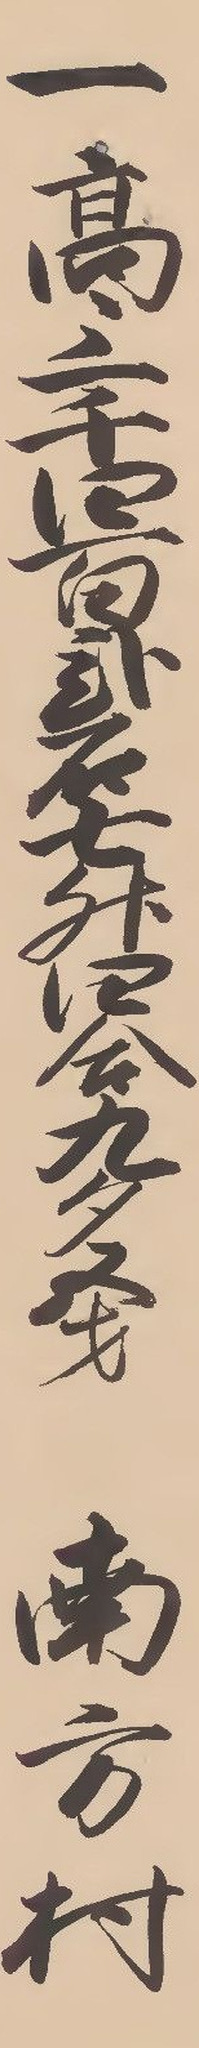一高三千四百弐石七升四合九勺五才南方村
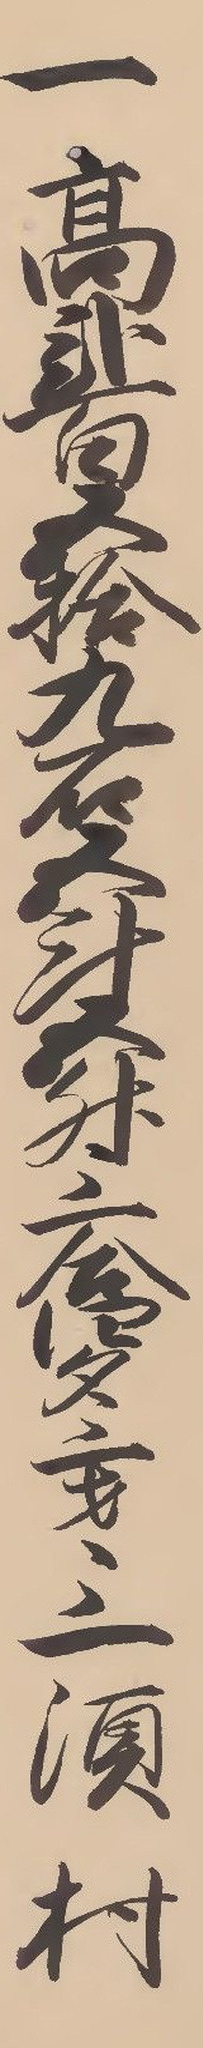一高弐百五拾九石五斗五升三合四勺三才三須村
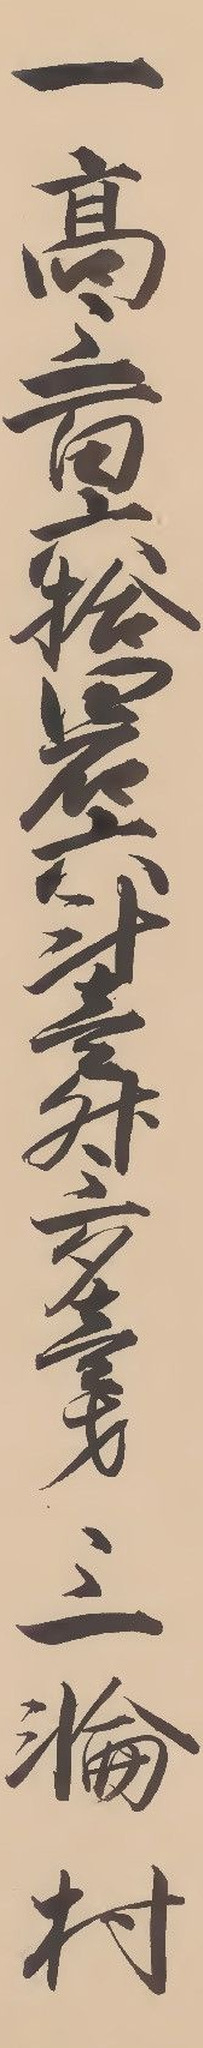一高三百六拾四石六斗壱升三勺壱才三輪村
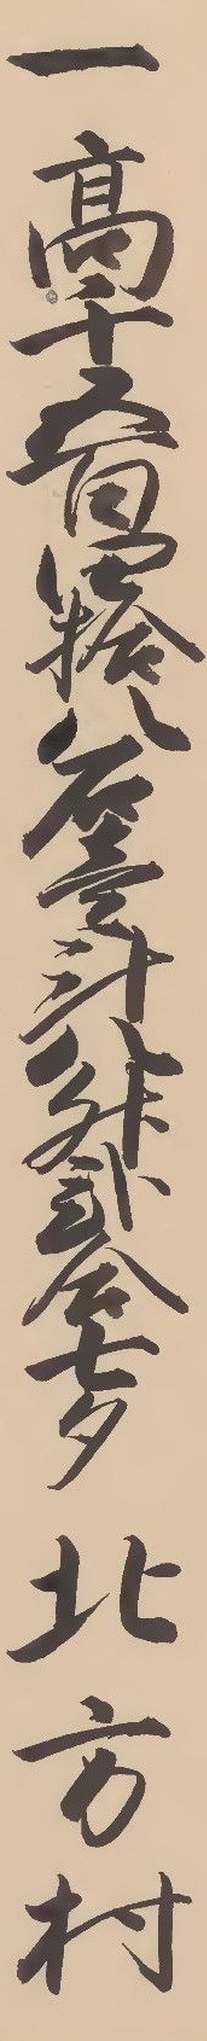一高千五百四拾八石壱斗八升弐合七勺北方村
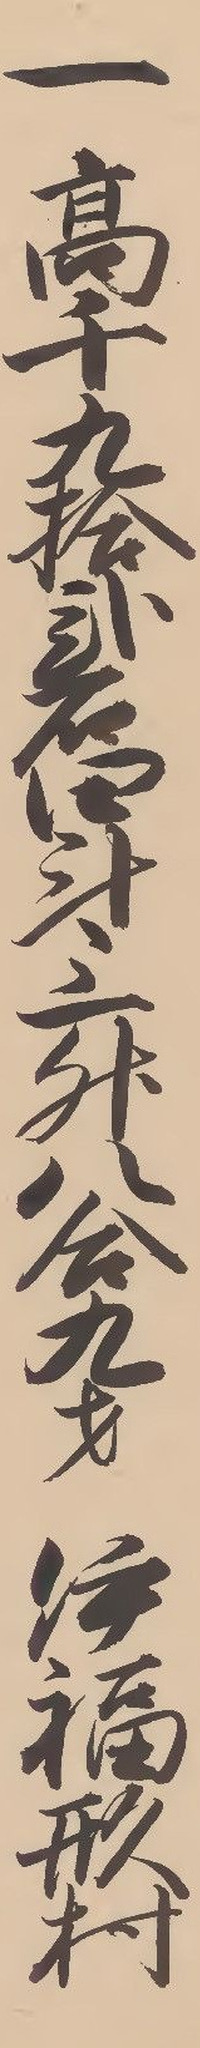一高千九拾弐石四斗三升八合九才伊福形村

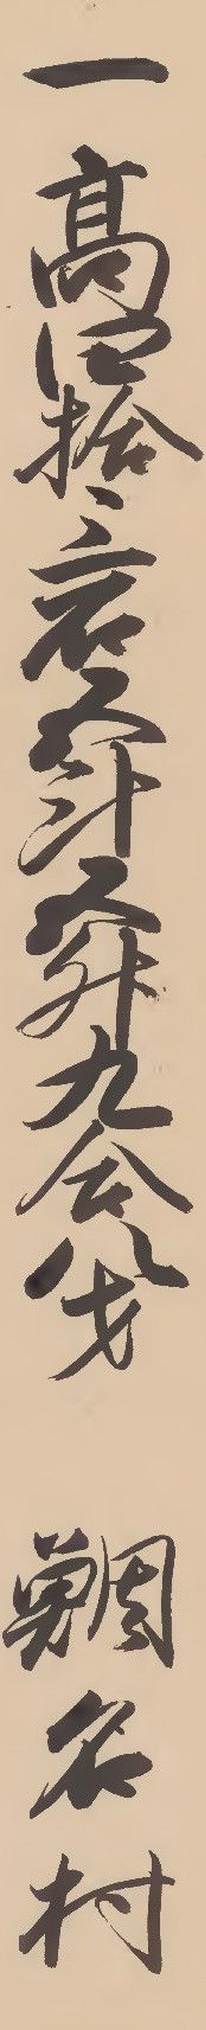一高四拾三石五斗五升九合八才鯛名村
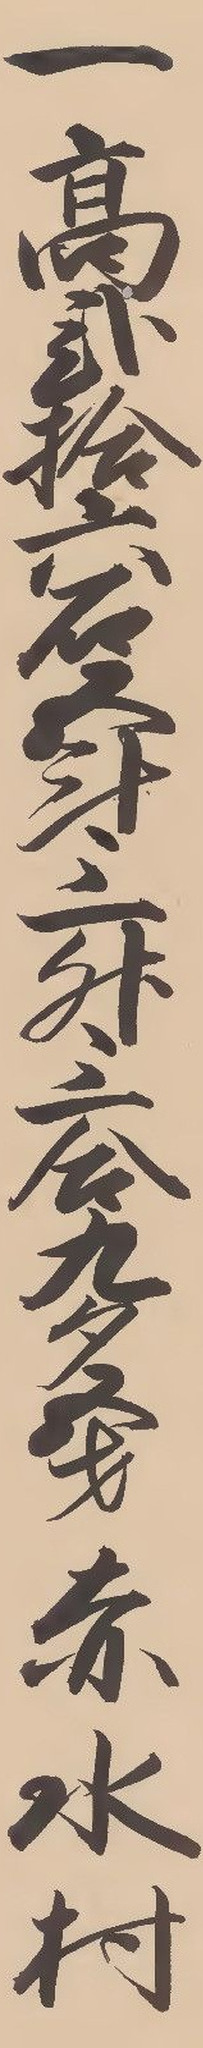一高弐拾六石五斗三升三合九勺五才赤水村
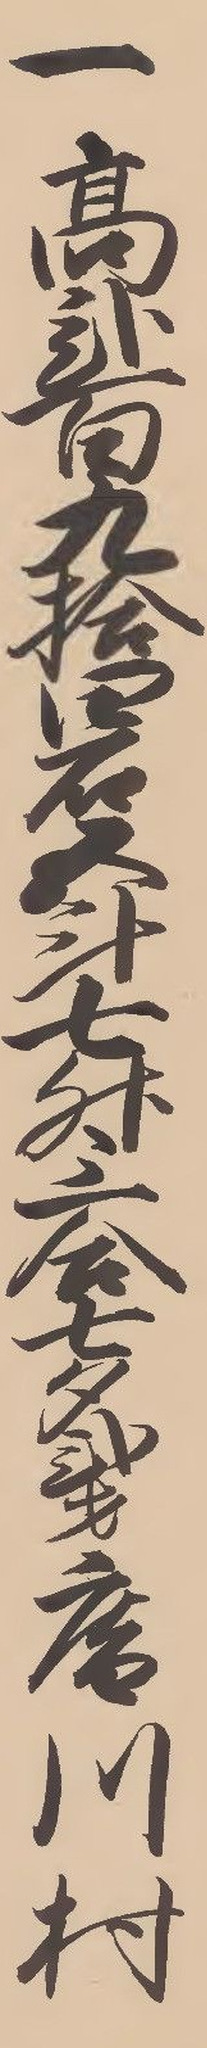一高弐百九拾四石五斗七升三合七夕弐才庵川村
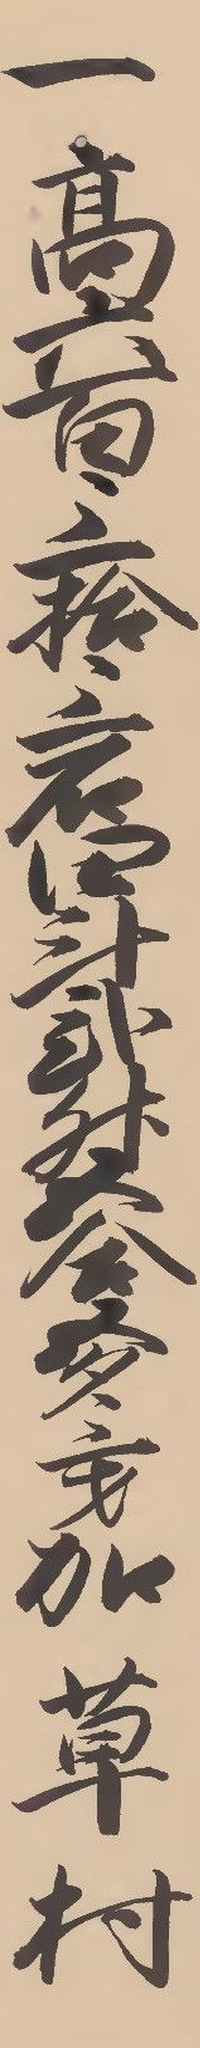一高六百三拾三石四斗弐升五合五勺三才加草村
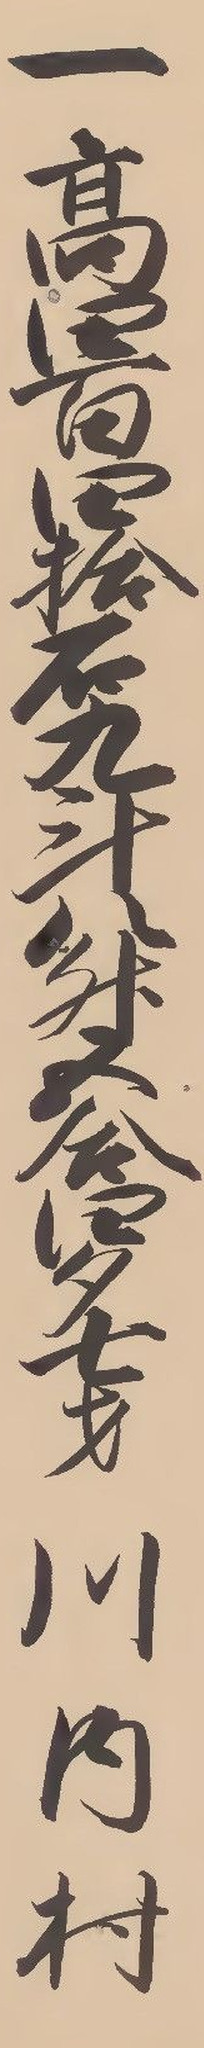一高四百四拾石九斗八升五合四勺七才川内村
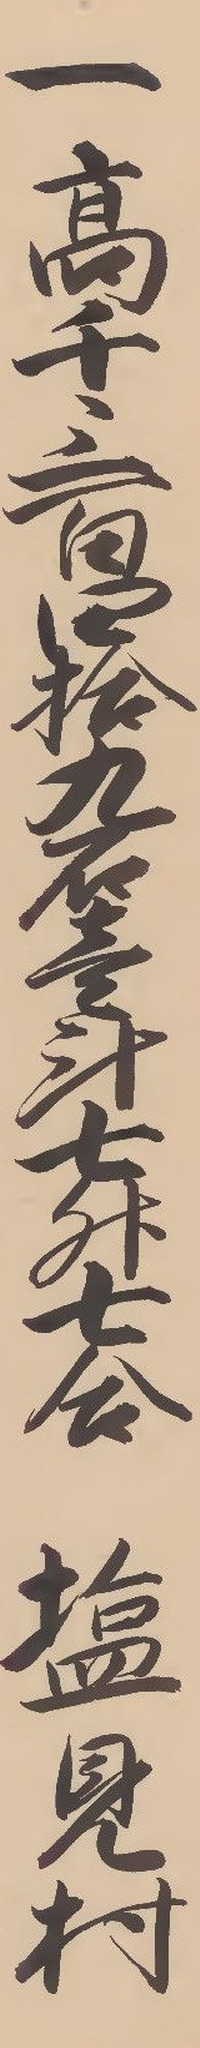一高千三百四拾九石壱斗七升七合塩見村

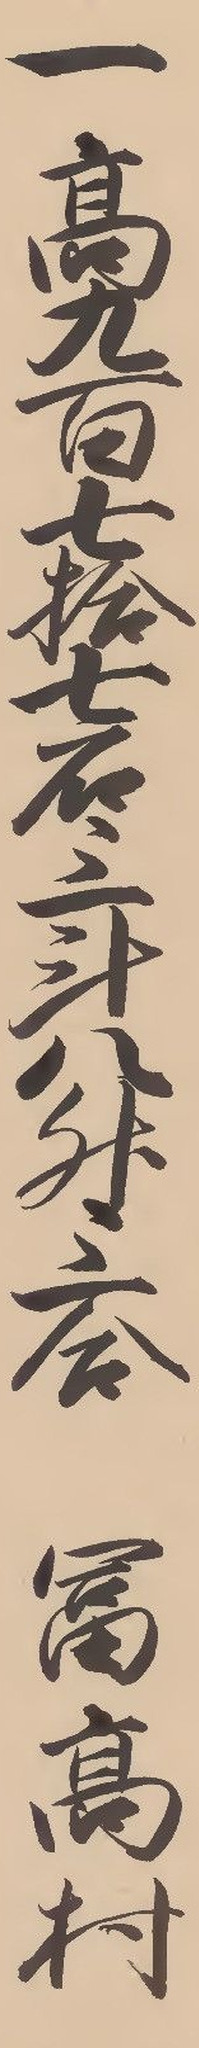一高九百七拾七石三斗八升三合富高村
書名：日向国郷帳
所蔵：国立公文書館 National Archives of Japan
